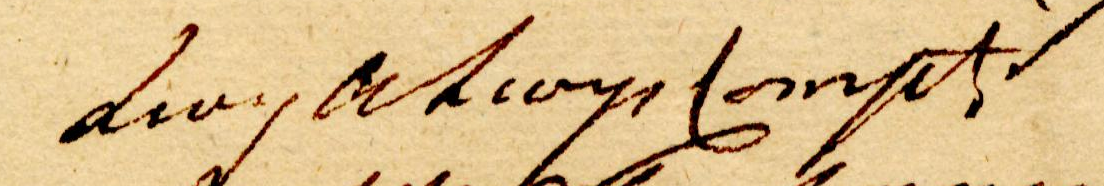Levy a Levys Compts
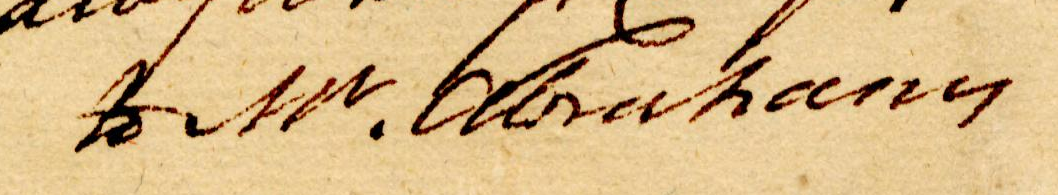to M^r. Abraham
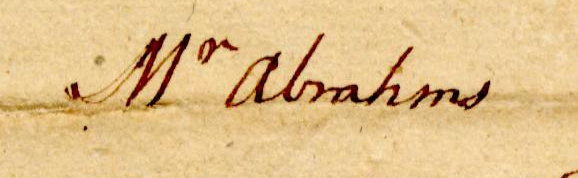M^r. Abrahms
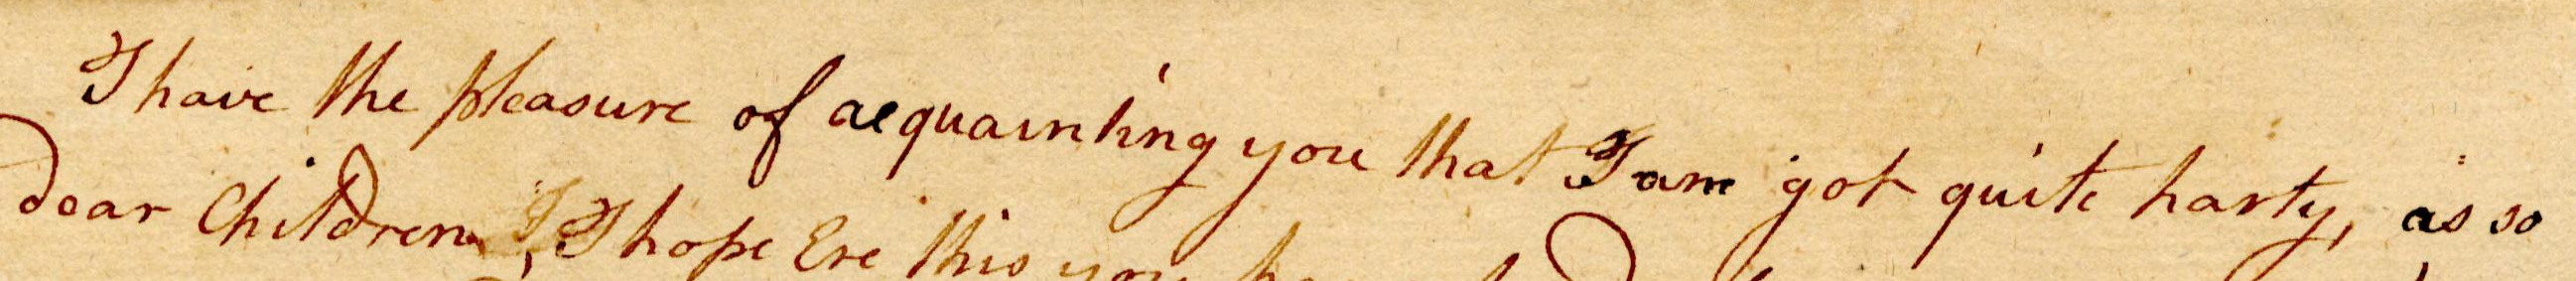I have the pleasure of acquainting you that I am got quite harty, as so
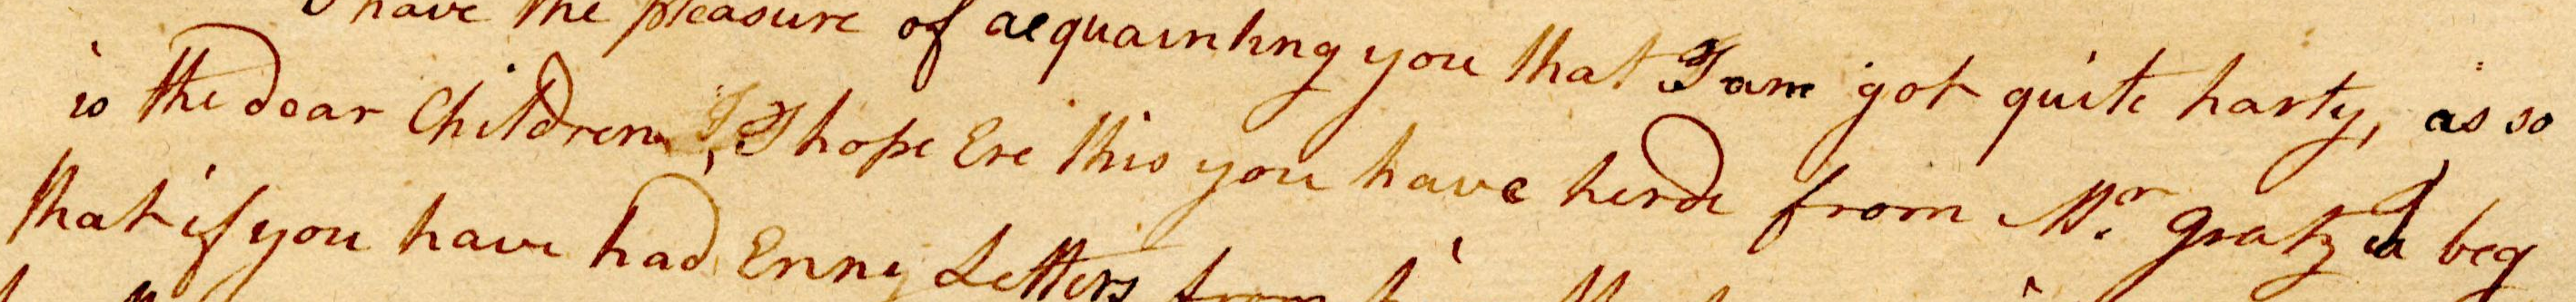is the dear children, I hope Ere this you have herde from M^r. gratz I beg
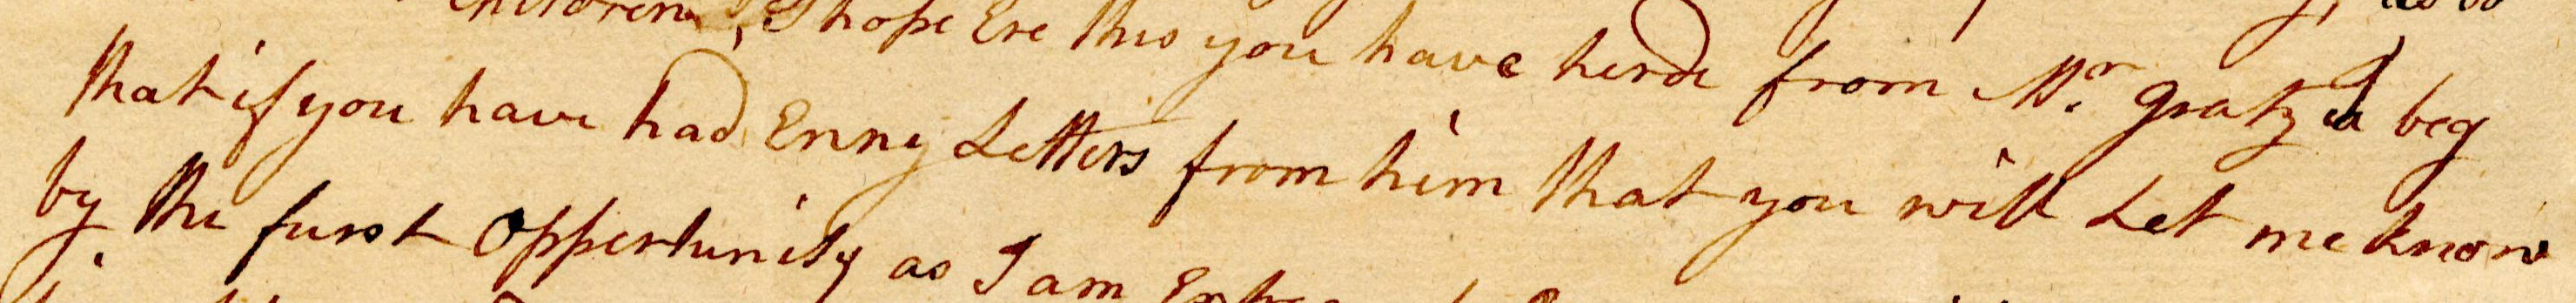that if you have had Enny Letters from him that you will Let me know
